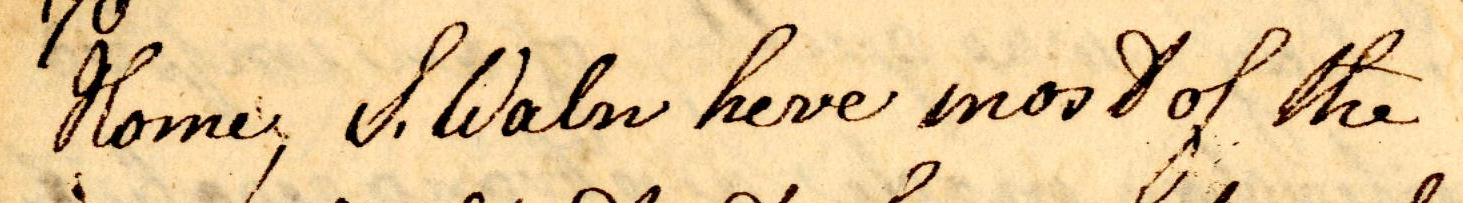Home, S. Waln here most of the
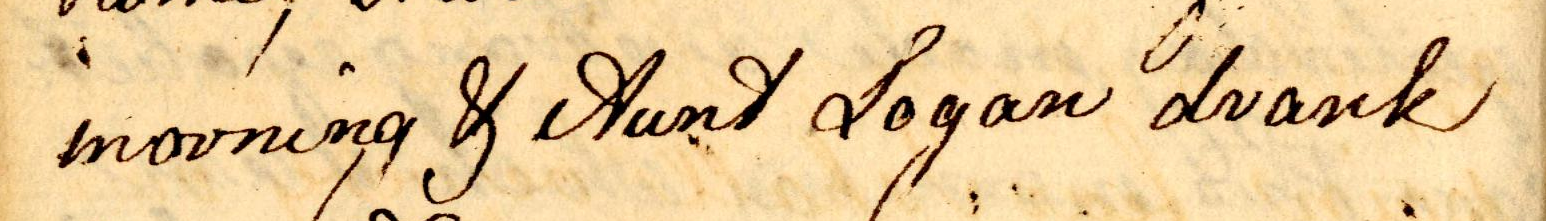morning & Aunt Logan drank
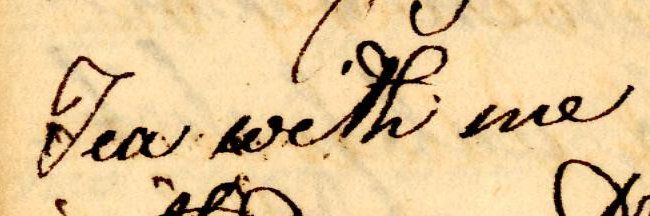Tea with me
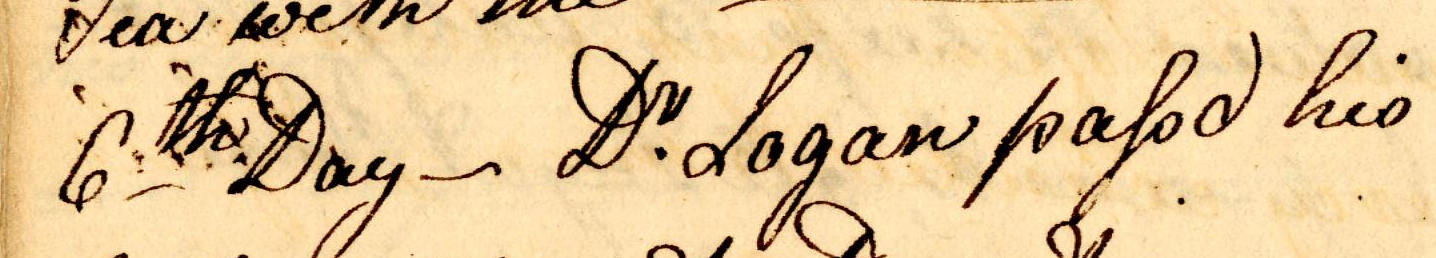6^th Day- D^r. Logan passd his
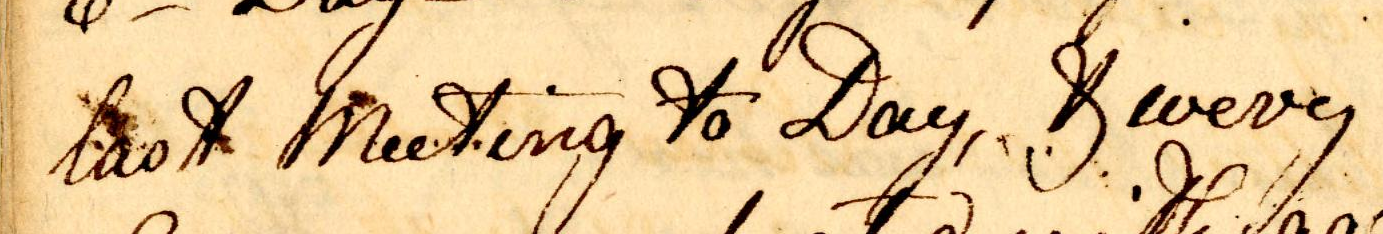last Meeting to Day, & every
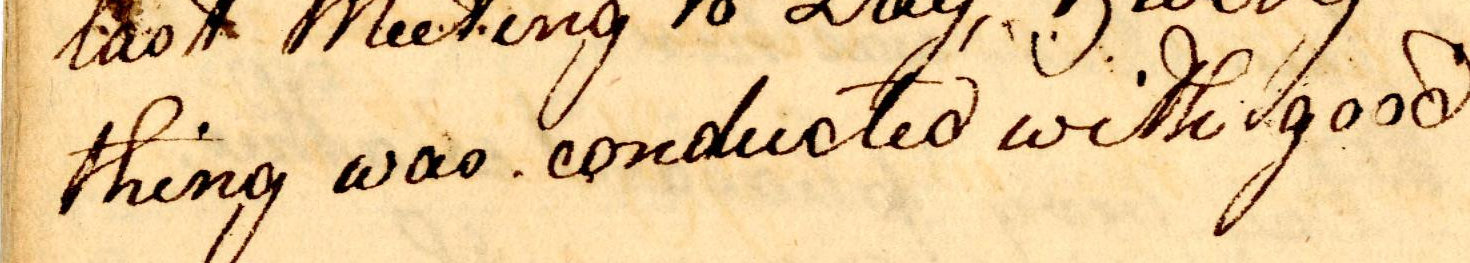thing was conducted with good
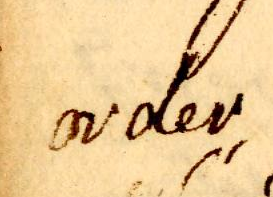order,
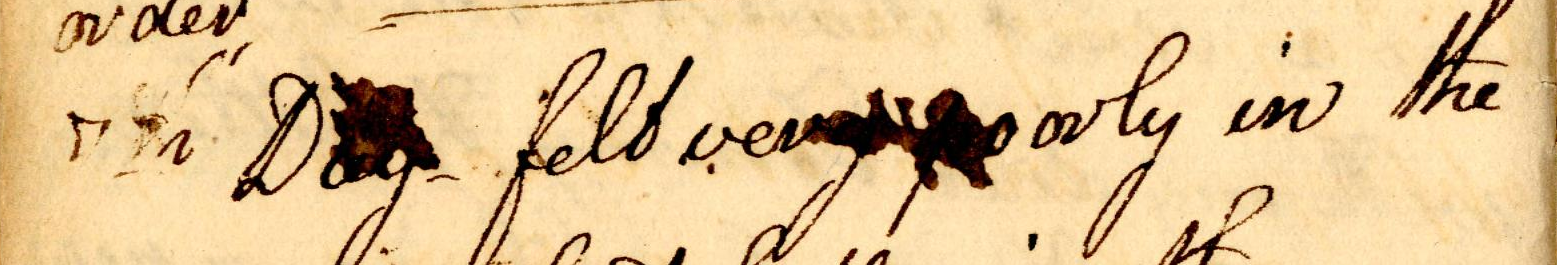7^th Day- felt very poorly in the
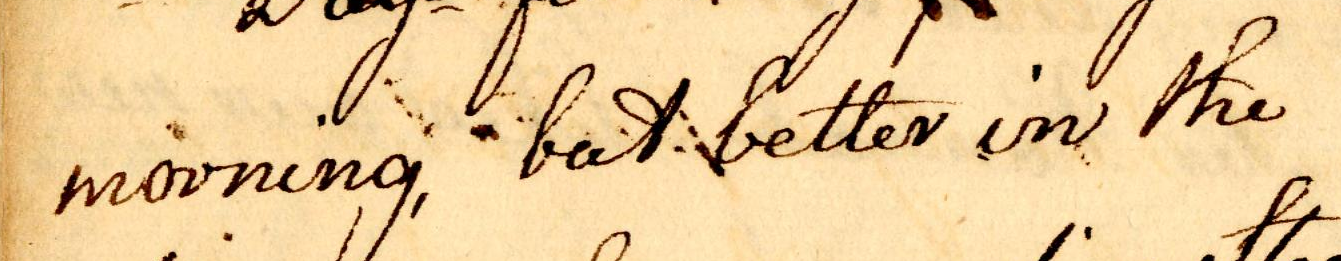morning, but better in the
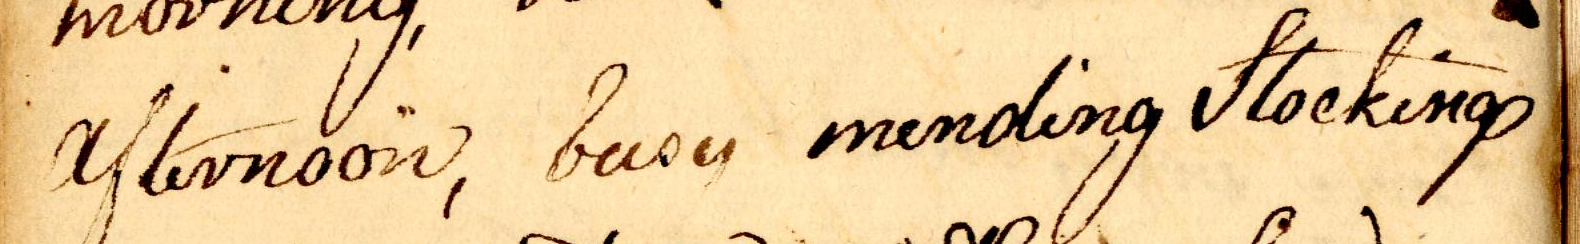Afternoon, busy mending Stockings
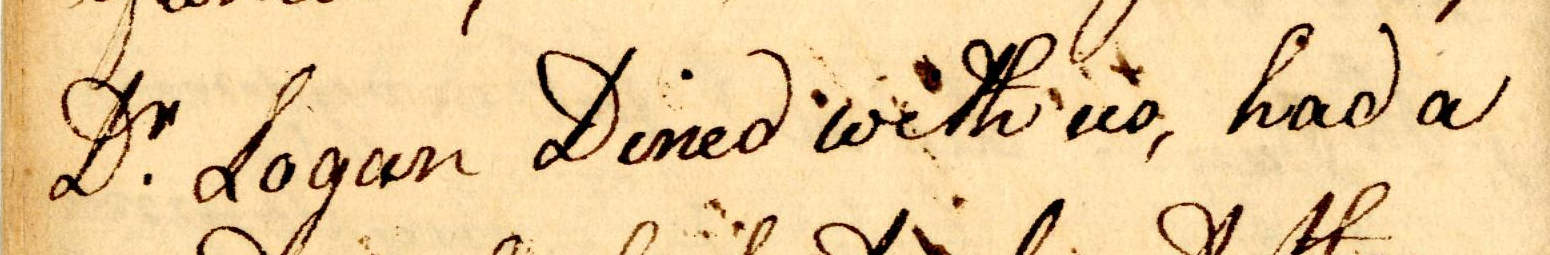D^r. Logan dined with us, had a
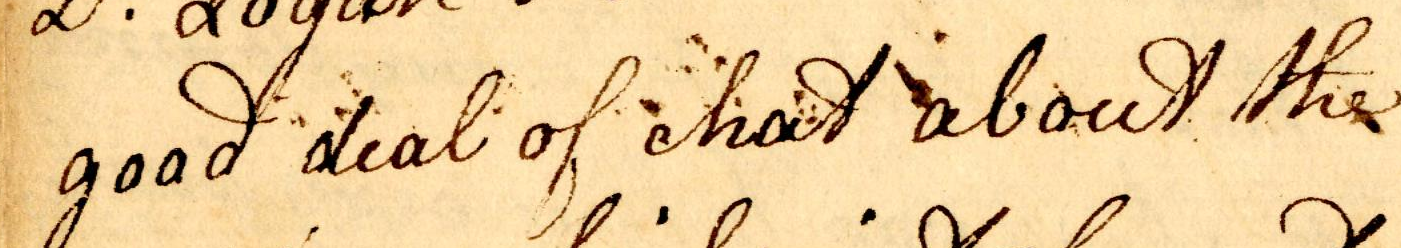good deal of chat about the
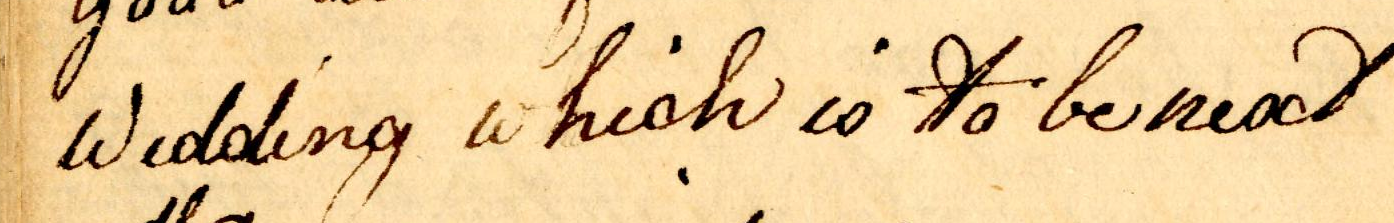Wedding which is to be next
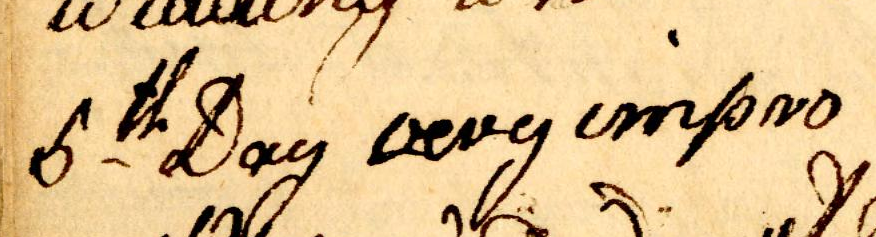5^th Day very impro
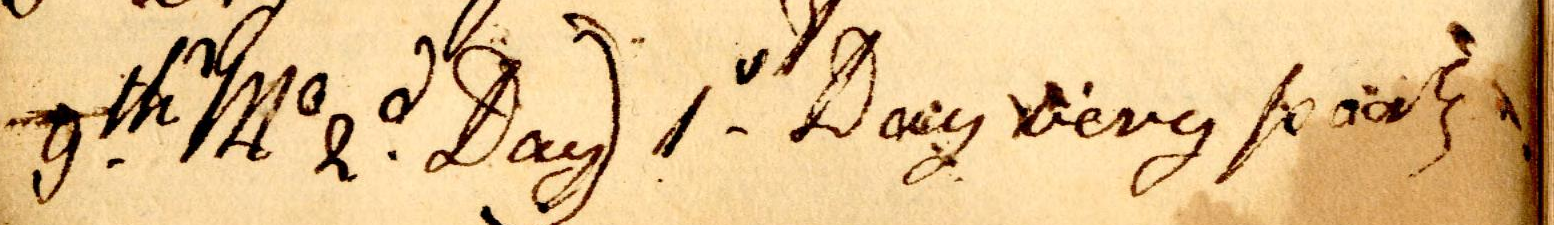9^th M^o 2^d. Day) 1^st Day very poor
